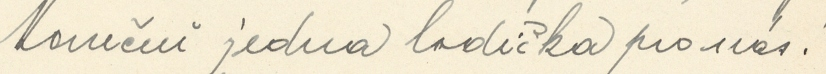Konečně jedna lodička pro nás!
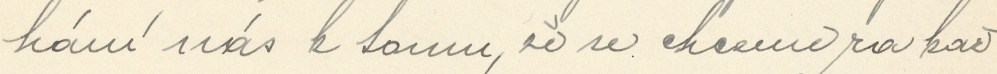hání nás k tomu, že se chceme za kaž-
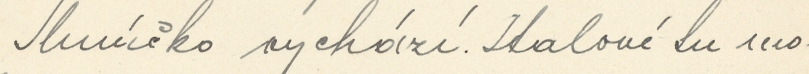Sluníčko vychází. Italové tu mo-
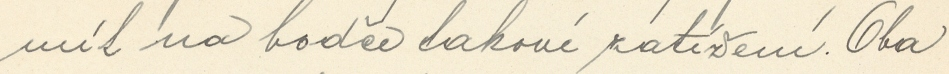mít na loďce takové zatížení. Oba
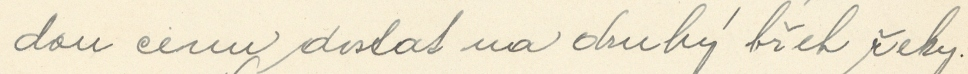dou cenu dostat na druhý břeh řeky.
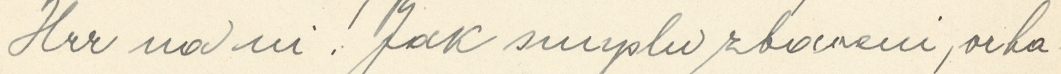Hrr na ni! Jak smyslu zbaveni, vrha-
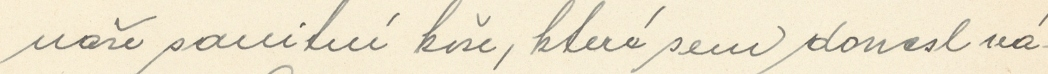naše sanitní koše, které sem donesl ná-
